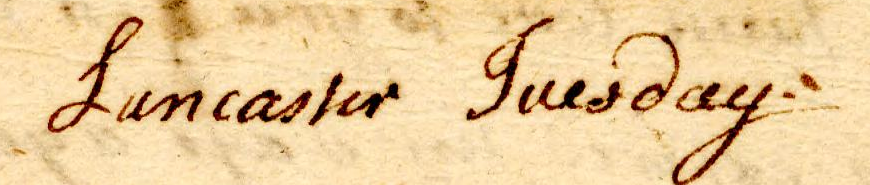Lancaster Tuesday.
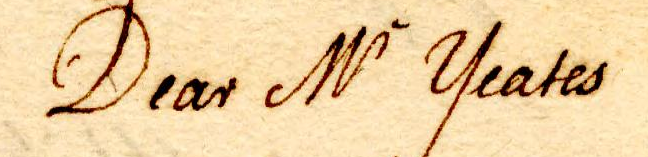Dear M^r Yeates
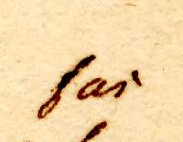far
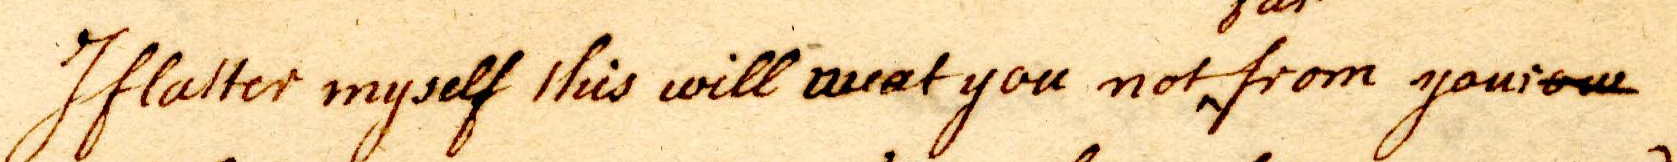I flatter myself this will meat you not ^ from your our
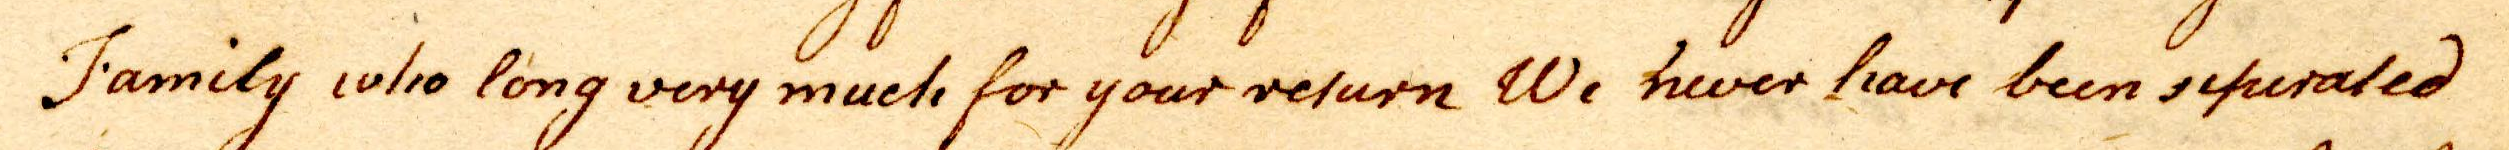Family who long very much for your return. We never have been seperated
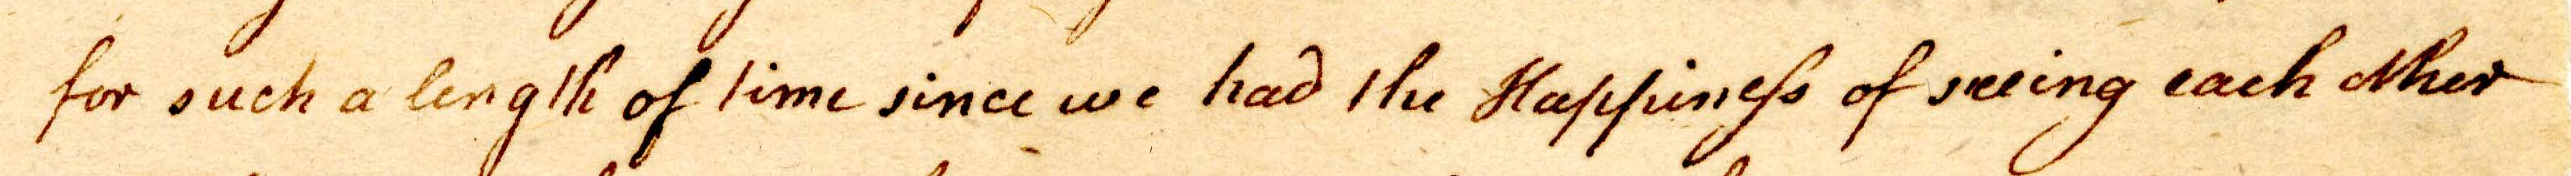for such a length of time since we had the Happiness of seeing each other
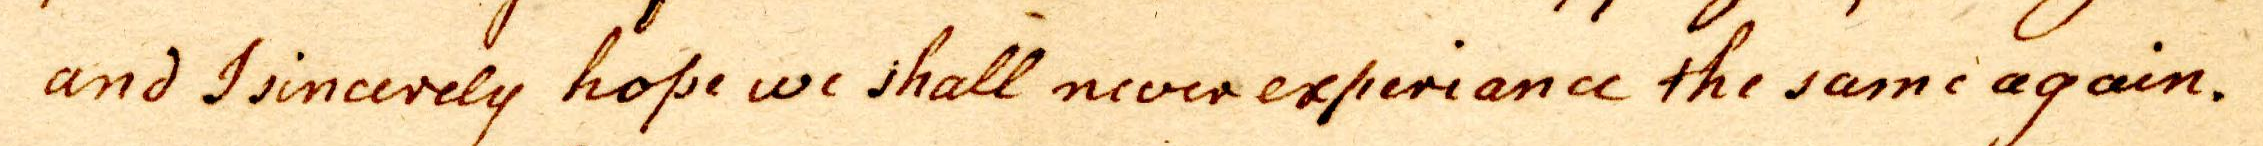and I sincerely hope we shall never experiance the same again.
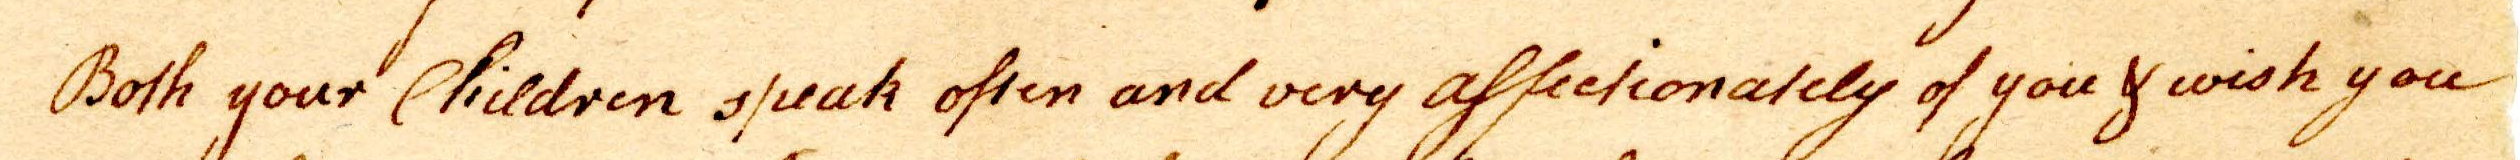Both your Children speak often and very affectionately of you & wish you
